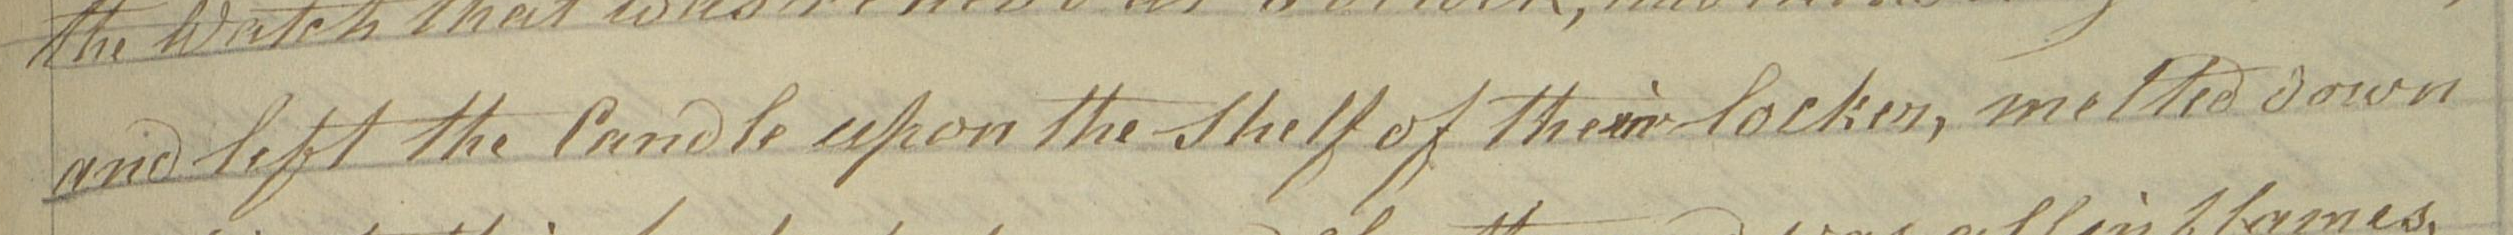and left the candle upon the Shelf of their locker, melted down
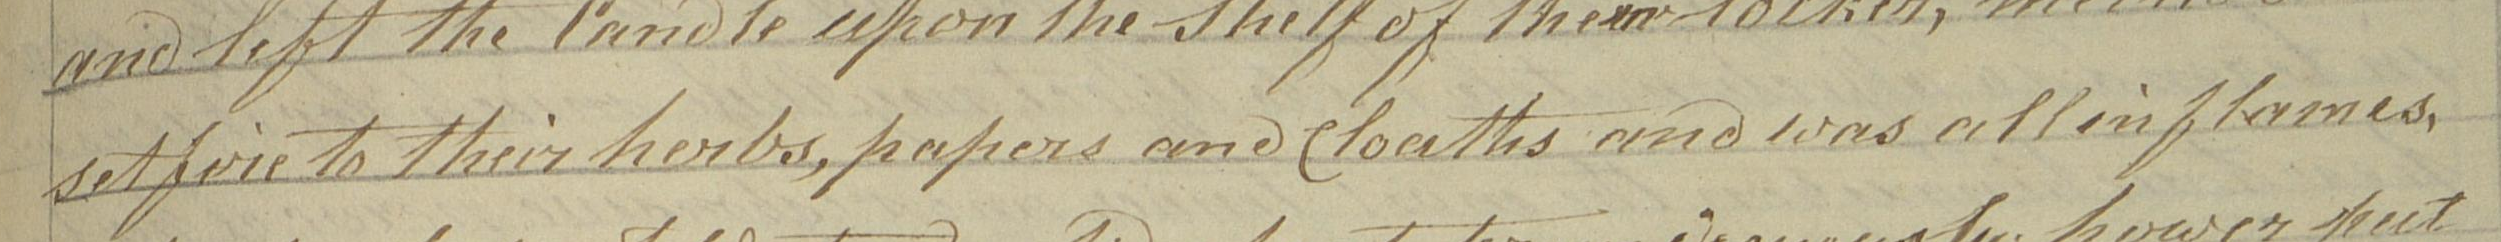set fire to their herbs, papers and Cloaths and was all in flames,
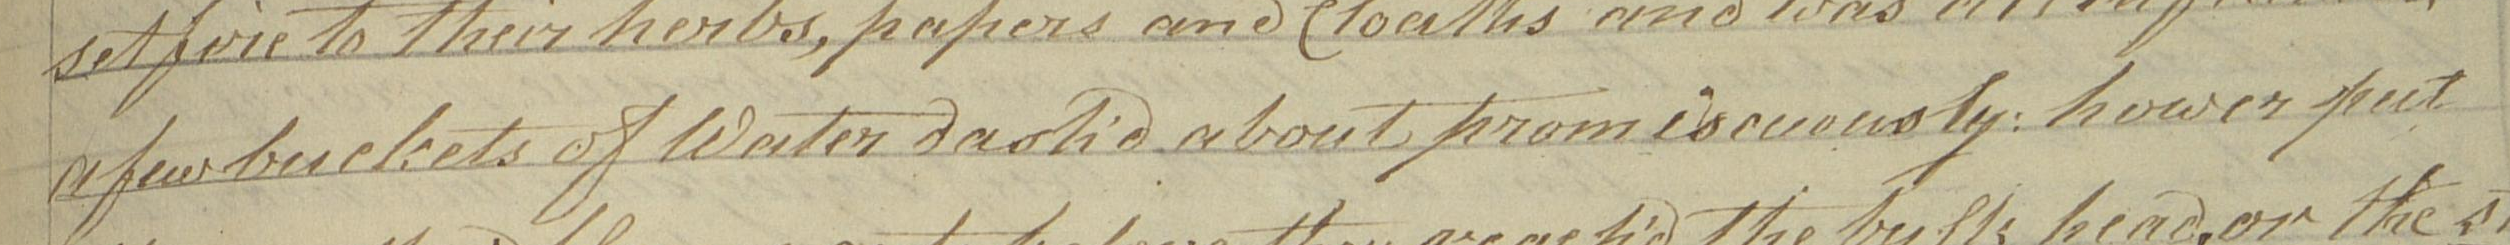a few buckets of Water dash'd about promiscuously: hower put
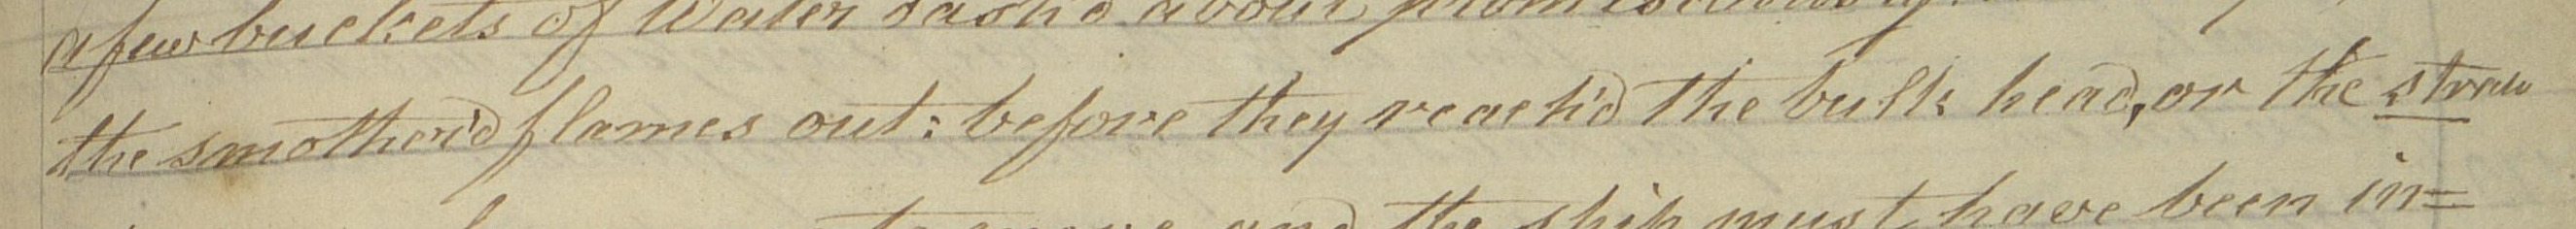the smother'd flames out; before they reach'd the bulk head, or the straw
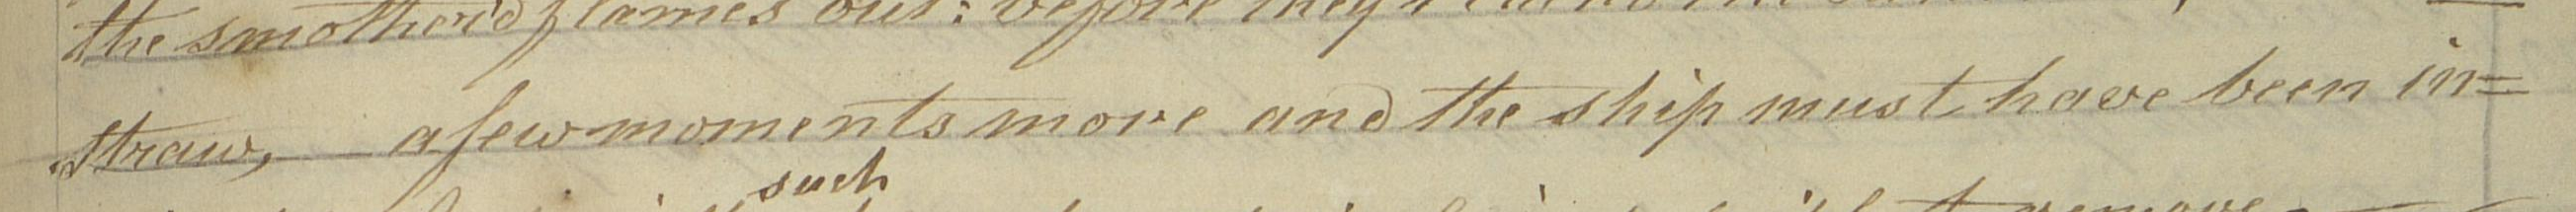straw, a few moments more and the ship must have been in-
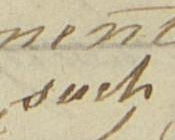such
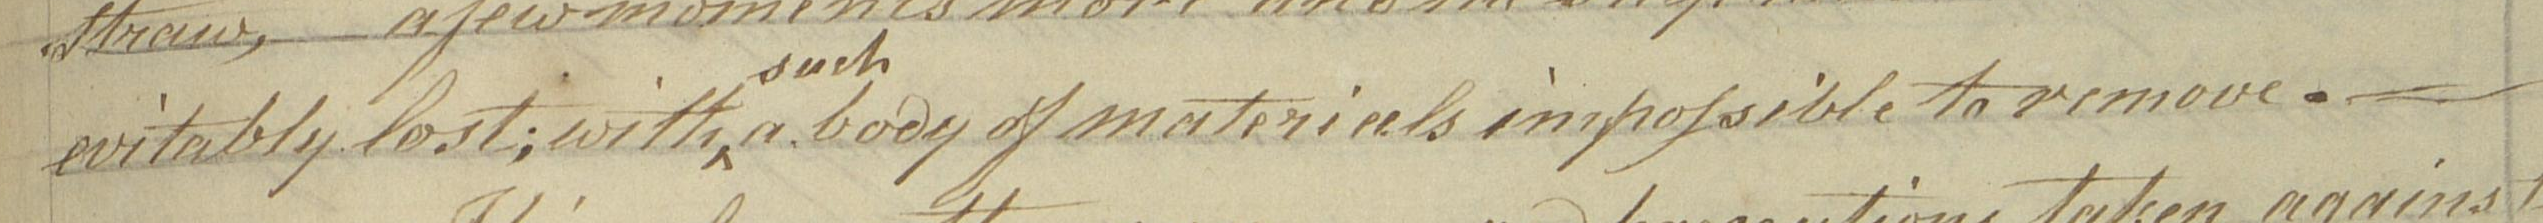evitably lost; with ^ a body of materials impossible to remove.
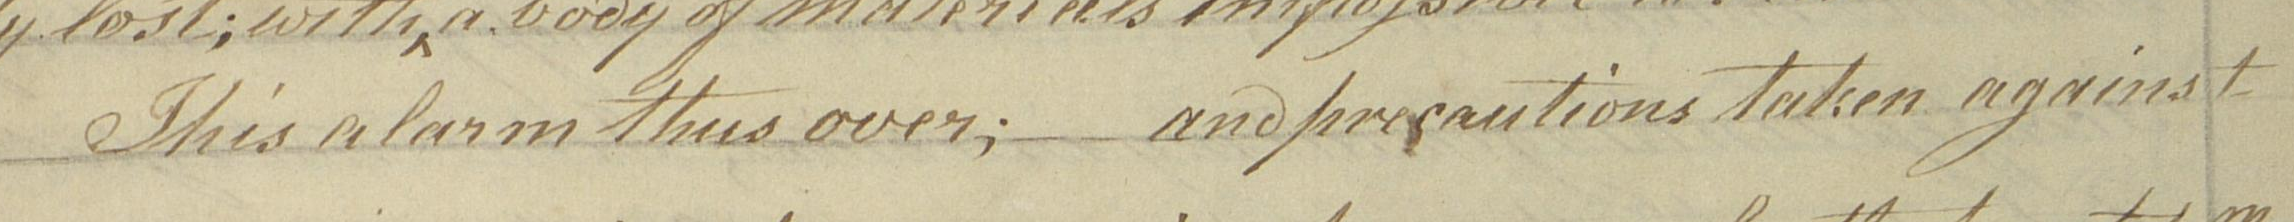This alarm thus over; and precautions taken against
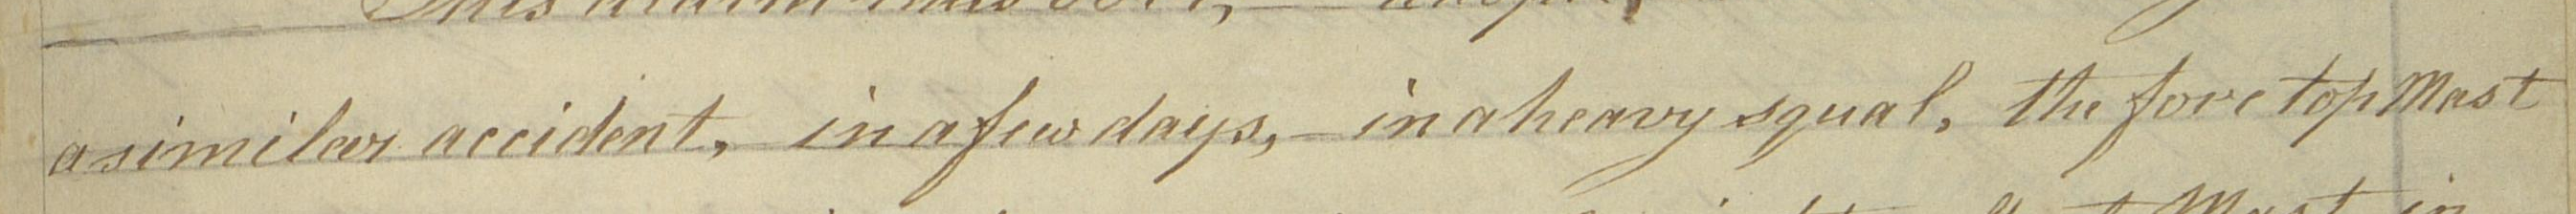a similar accident, in a few days, in a heavy squal, the fore top Mast
